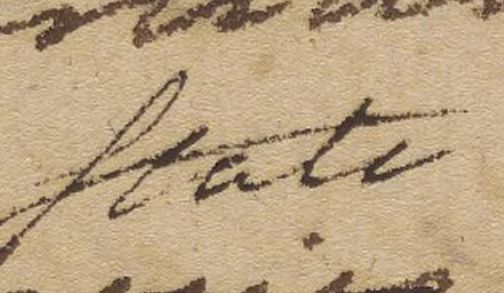State
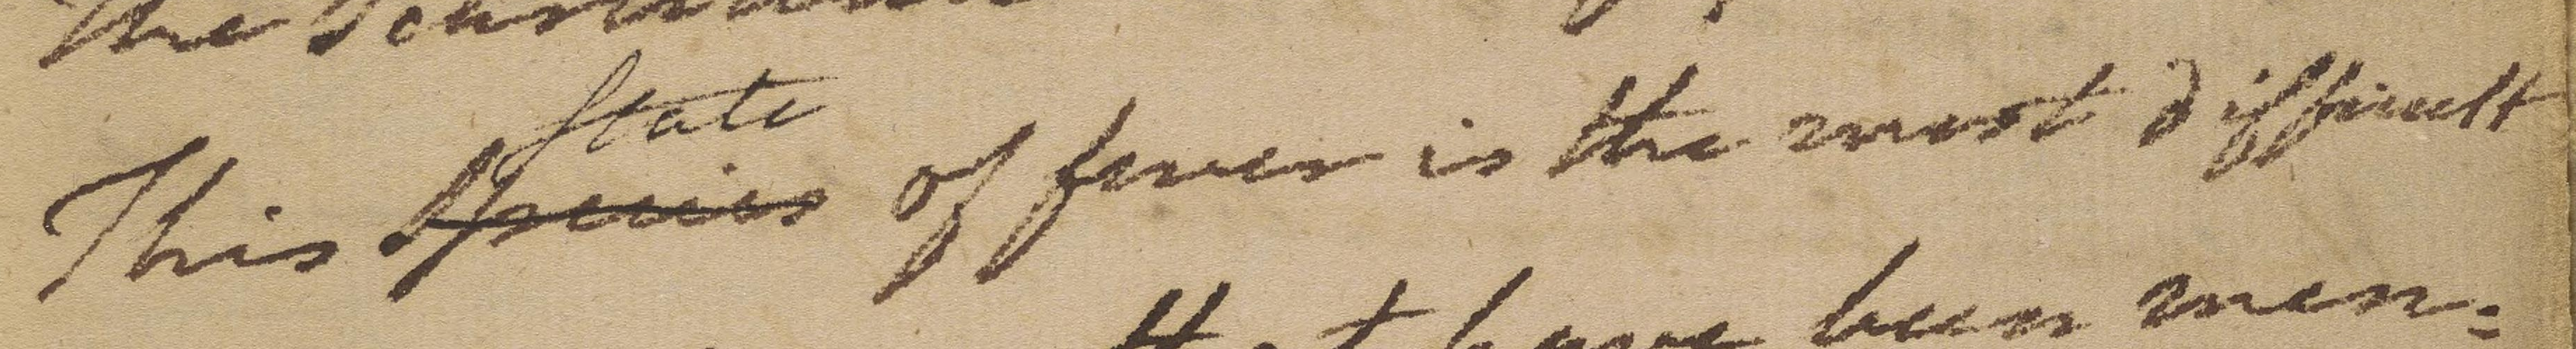This [species] of fever is the most difficult
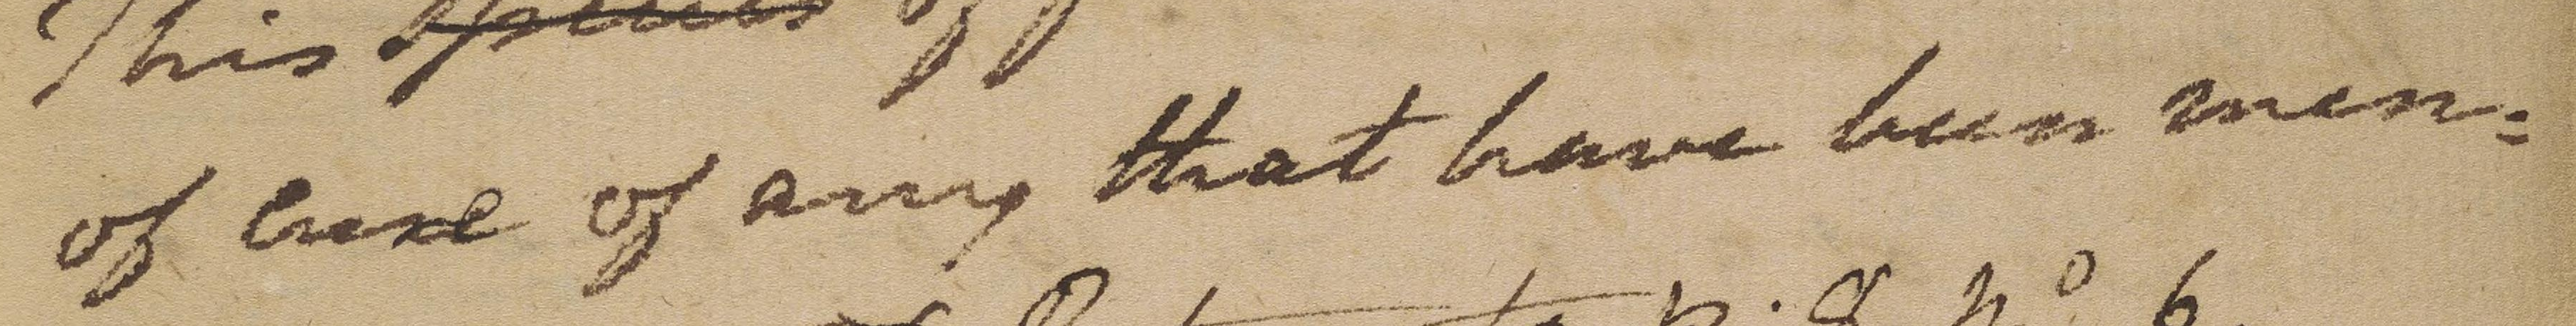of case of any that have been men-
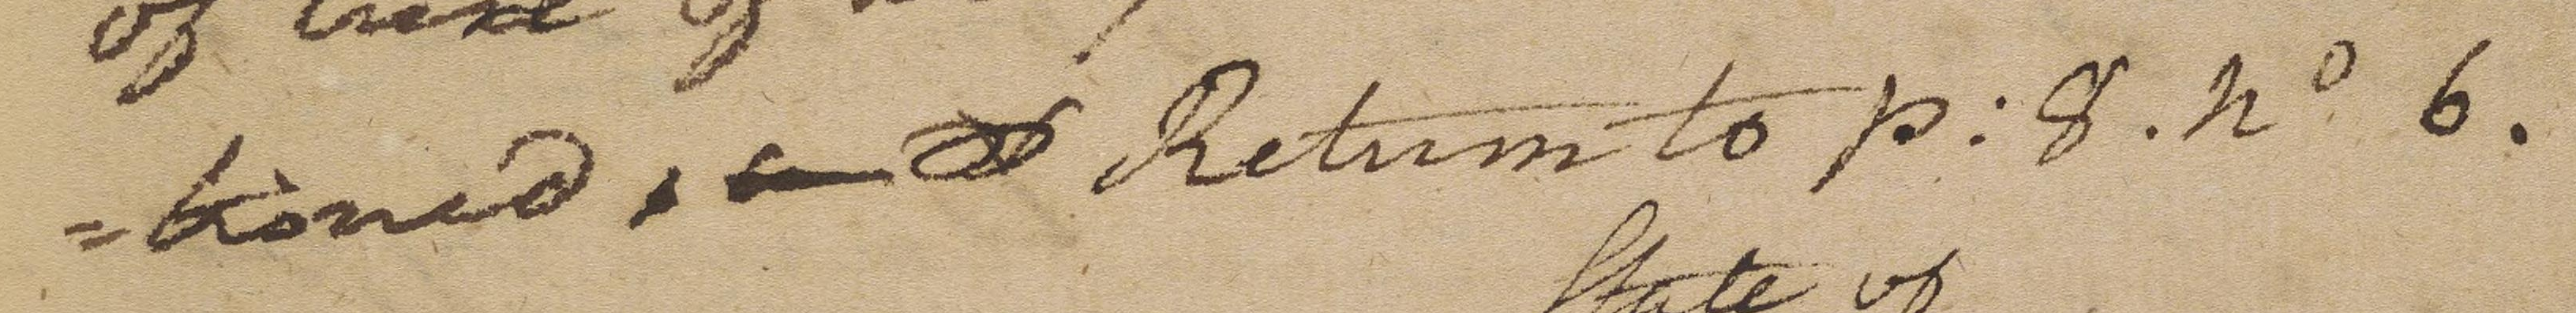-tioned. [_] Return to p. 8 N^o 6.
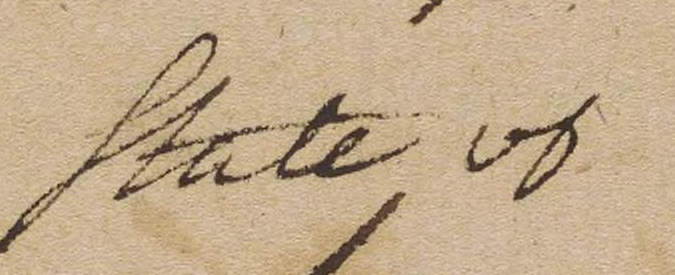State of
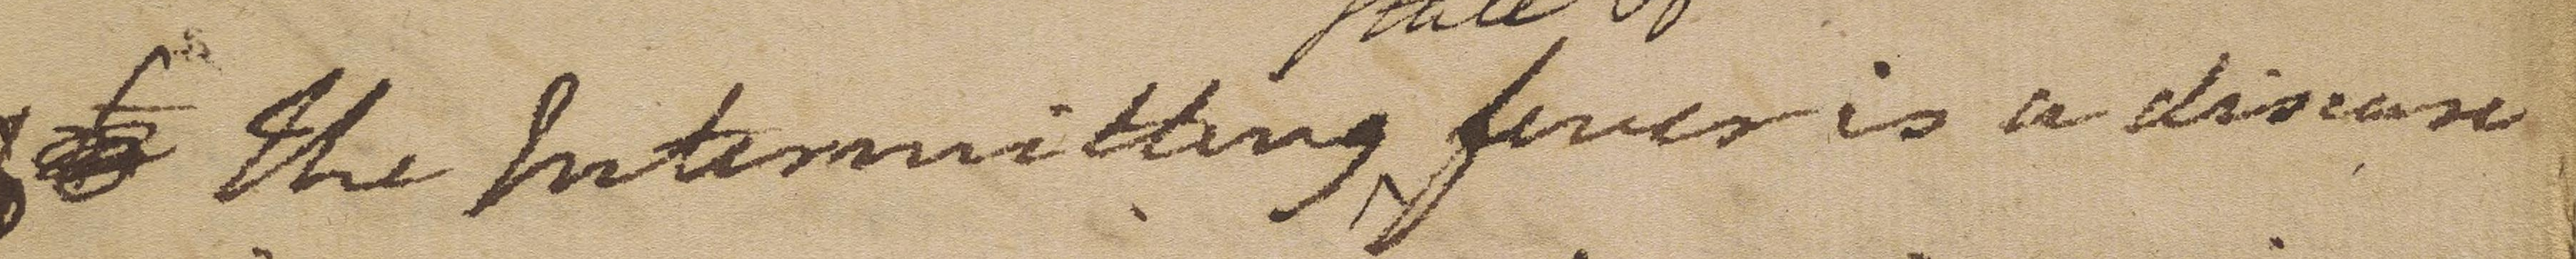The Intermitting ^ fever is a disease
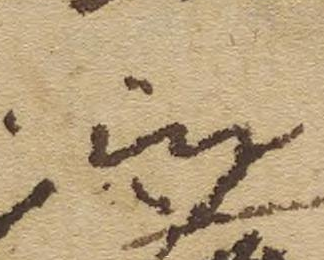in
